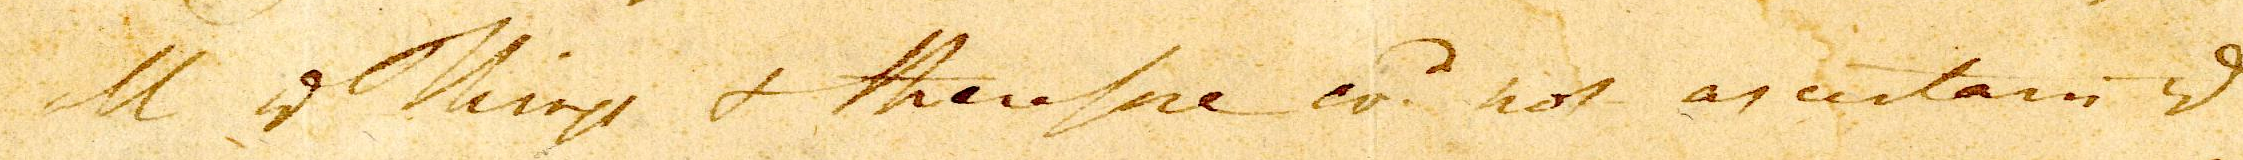all y^e things & therefore w^d. not ascertain y^e
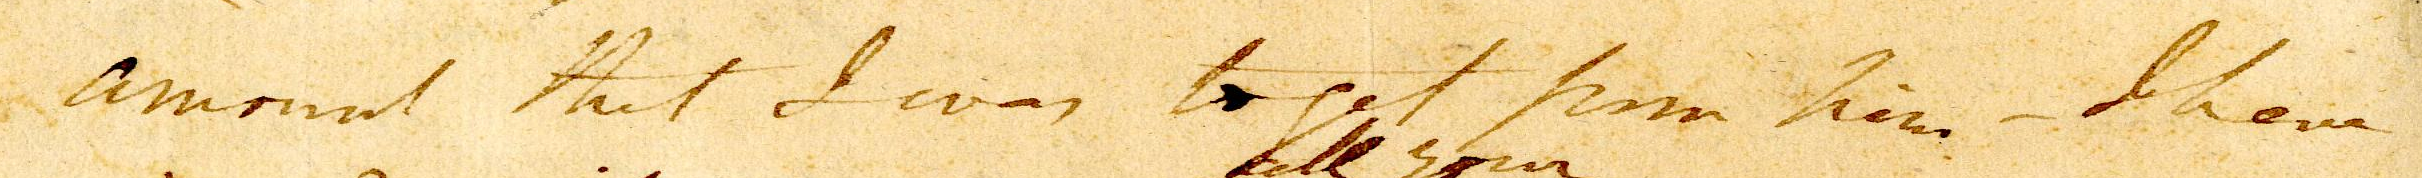amount that I was to get from him. I have
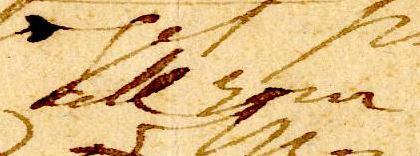all your
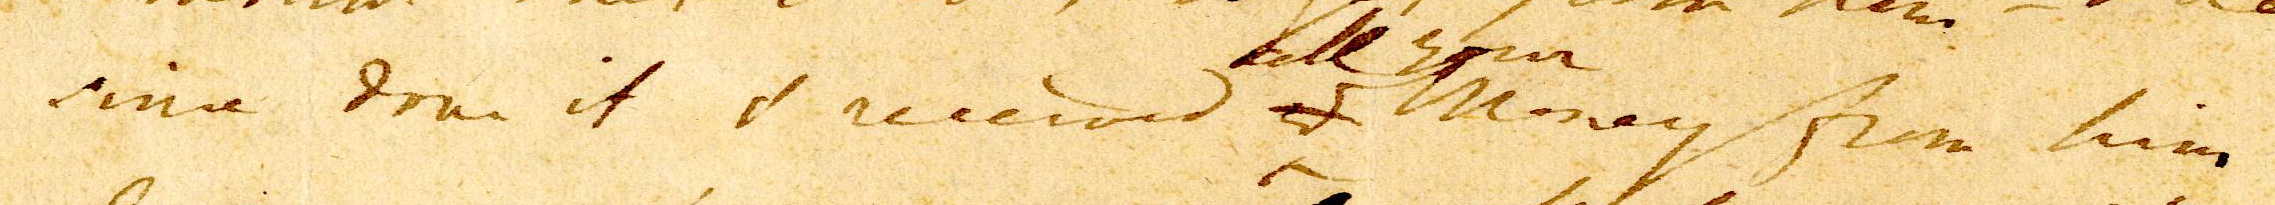since done it & received ^ y^e Money from him
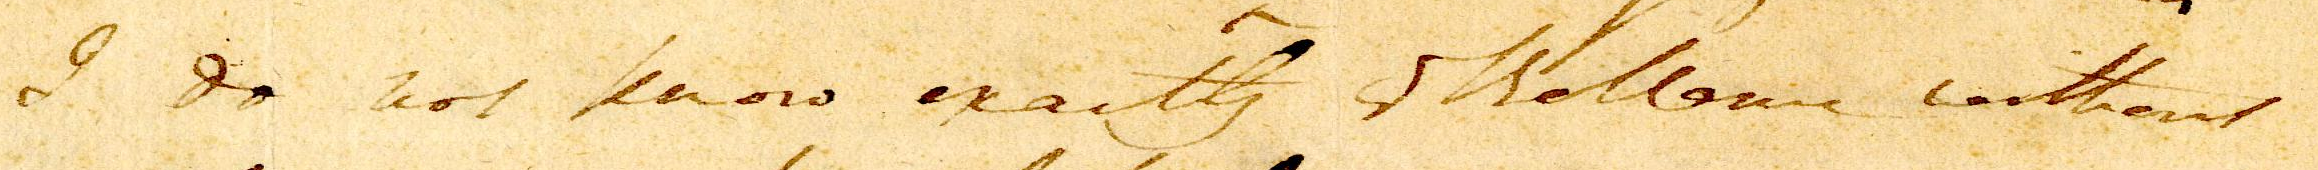I do not know exactly y^e Ballance without
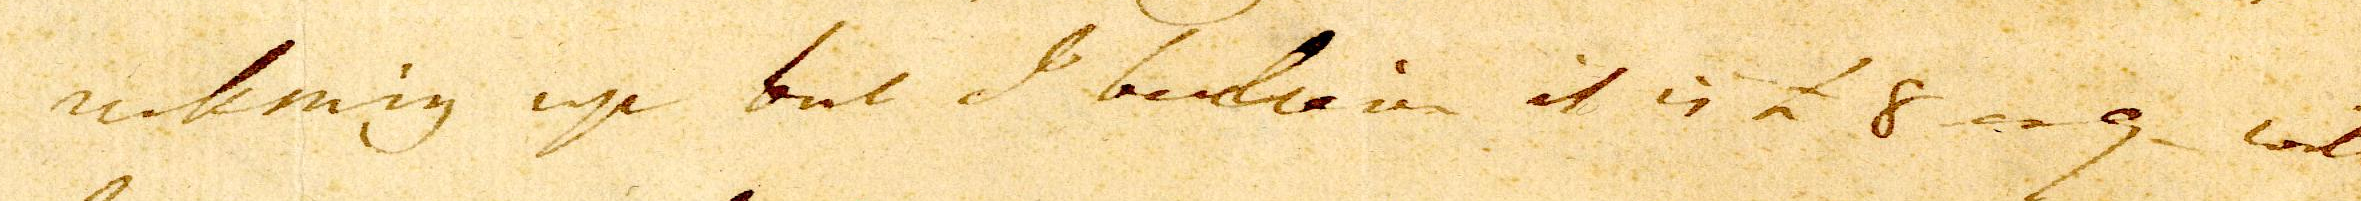reckoning up but I believe it is £8 or 9 will
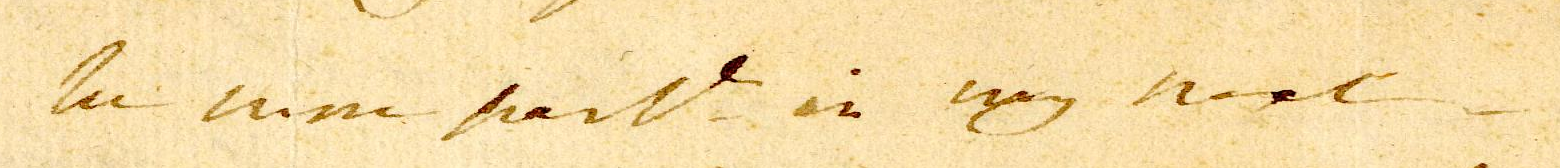be more part^l in my next
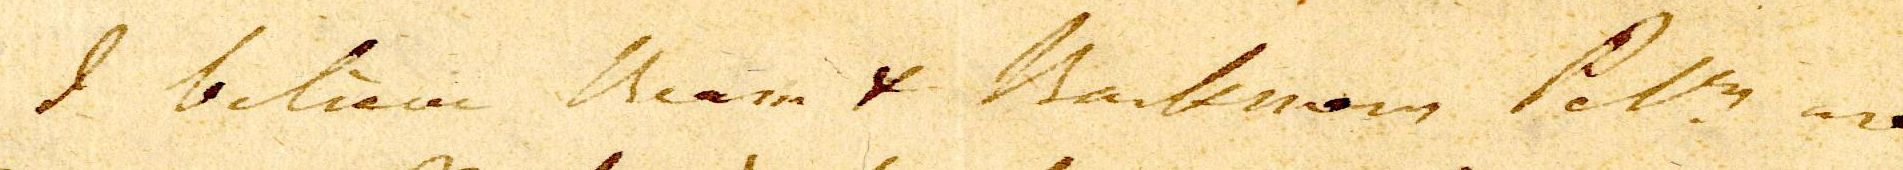I believe Ream & Bartimore Pet^n as
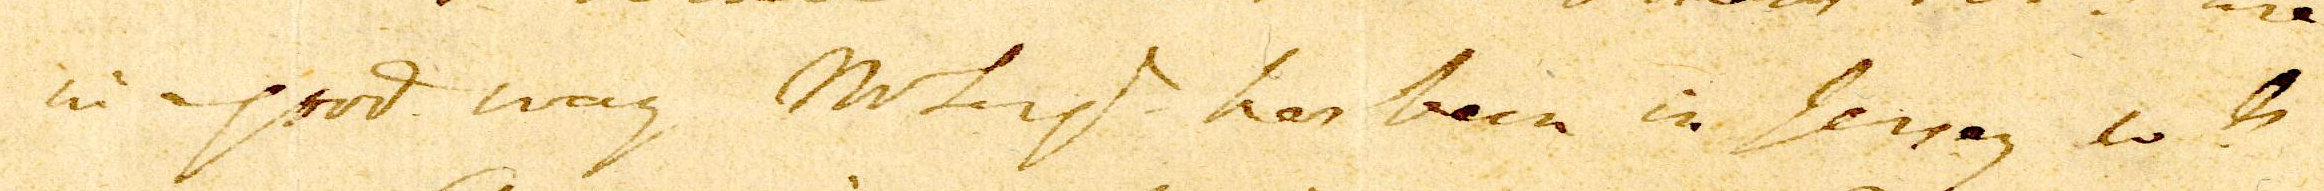in a good way M^r Lerg^t has been in Jersey w^h
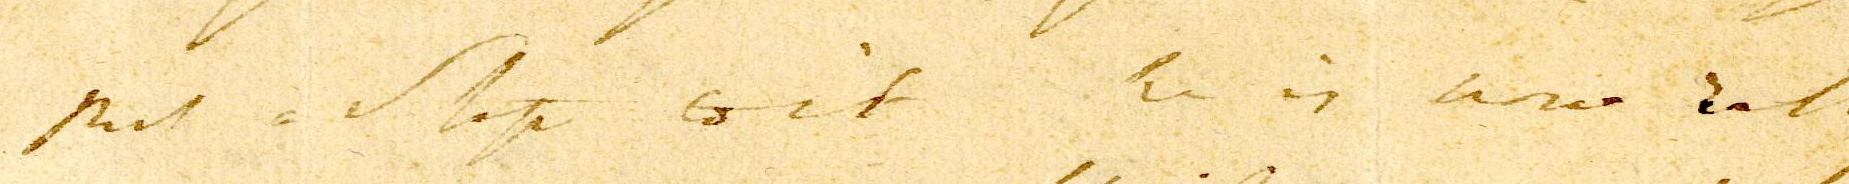put a stop to it he is here at
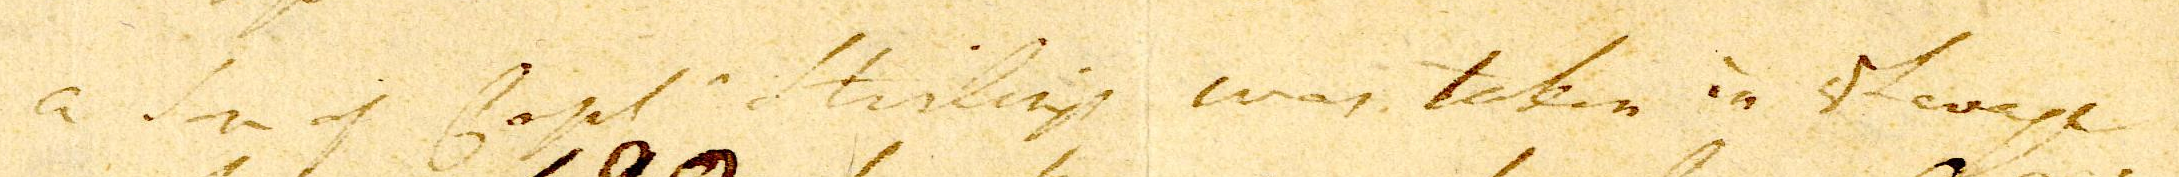a Son of Capt Starleys was taken in y^e Savage
